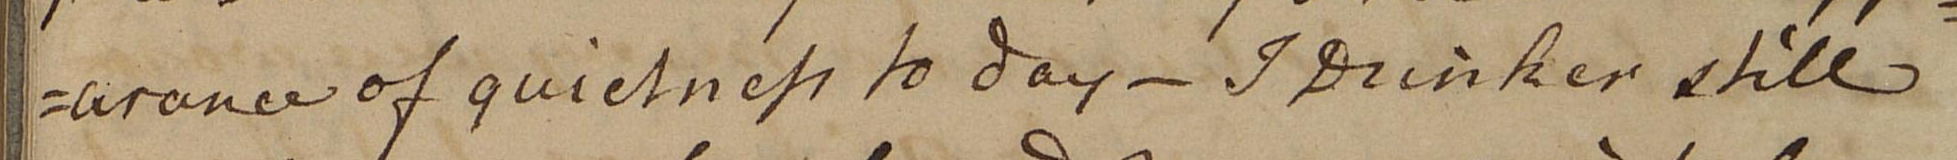-arance of quietness to day- I Drinker still
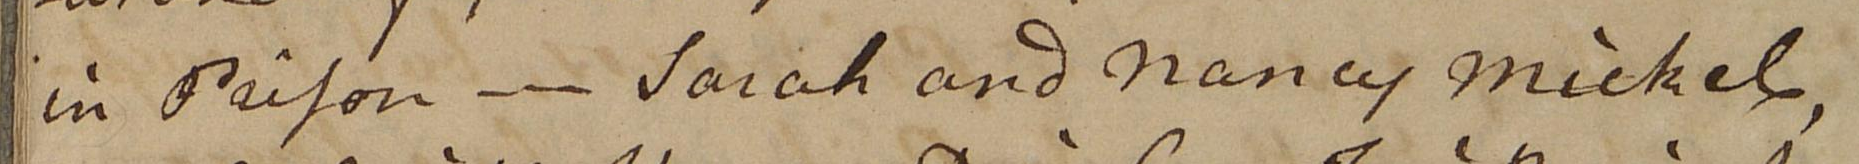in Prison- Sarah and Nancy Mickel,
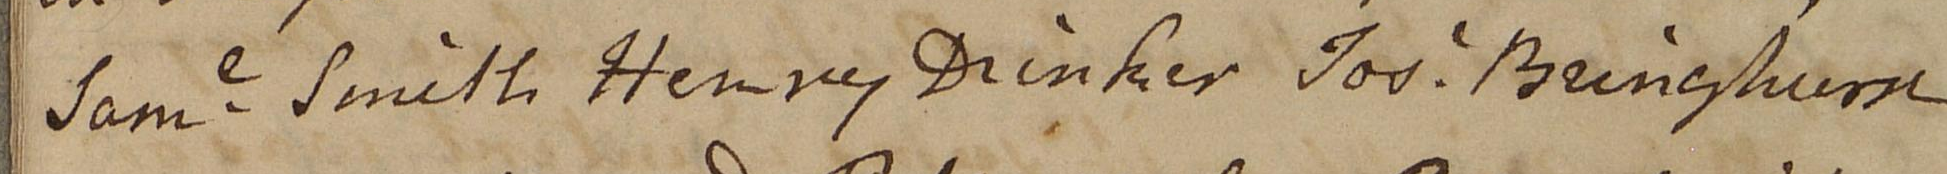Sam^l- Smith Henry Drinker Jos^l. Bringhurst
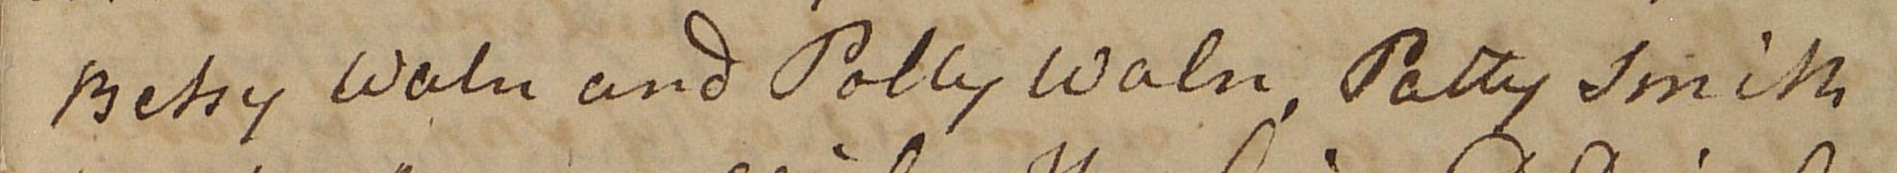Betsy Waln and Polly Waln, Patty Smith
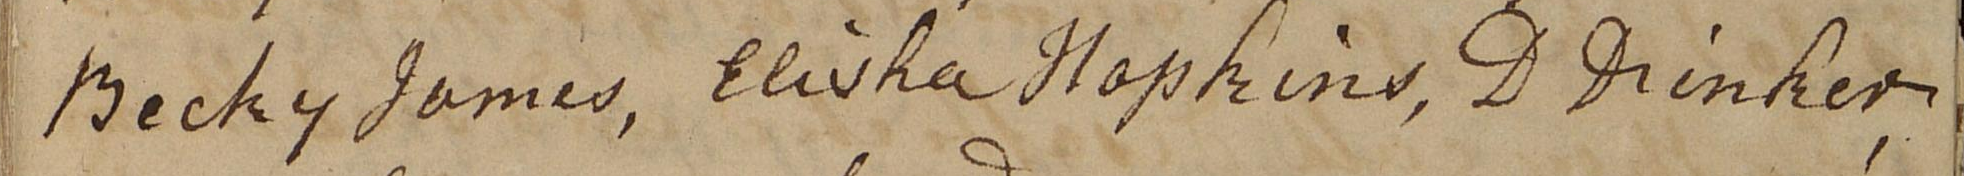Becky James, Elisha Hopkins, D Drinker,
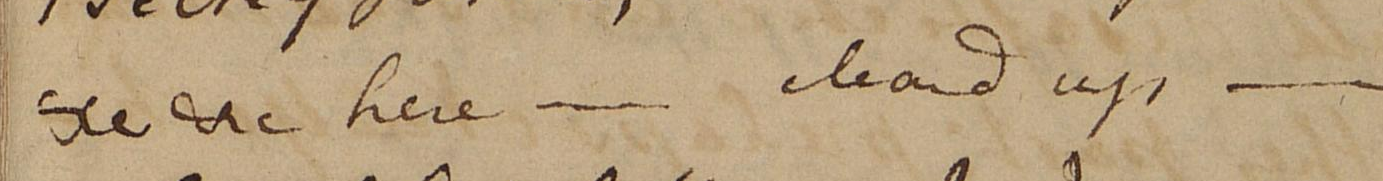&c &c here- cleard up-
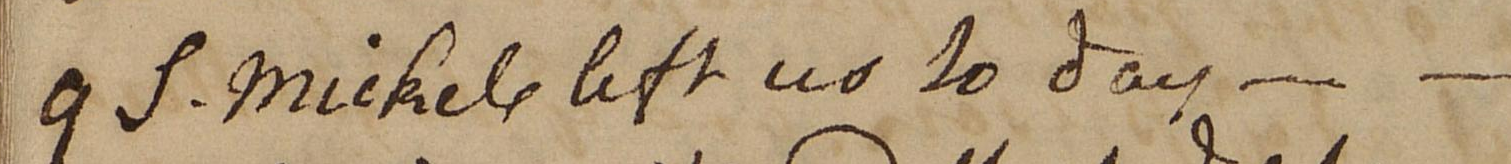9 S. Mickel left us to day--
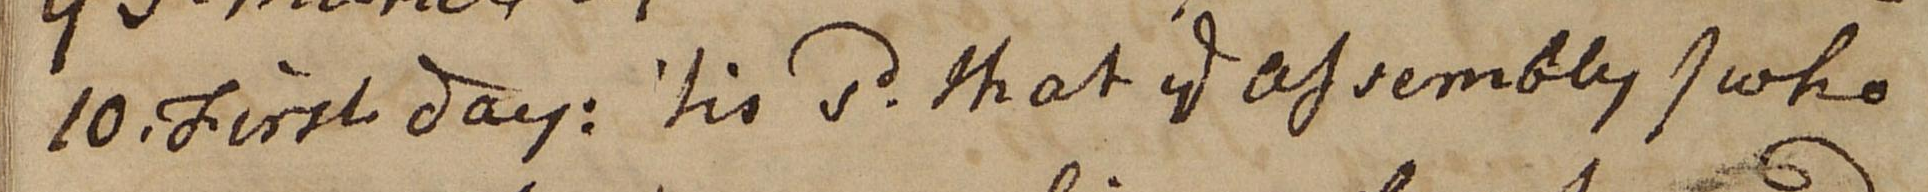10. First day: 'tis s^d. that y^e assembly (who
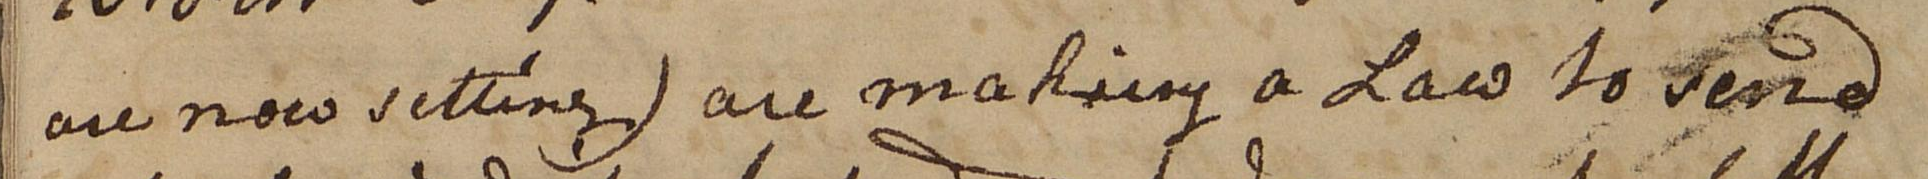are now setting) are making a Law to send
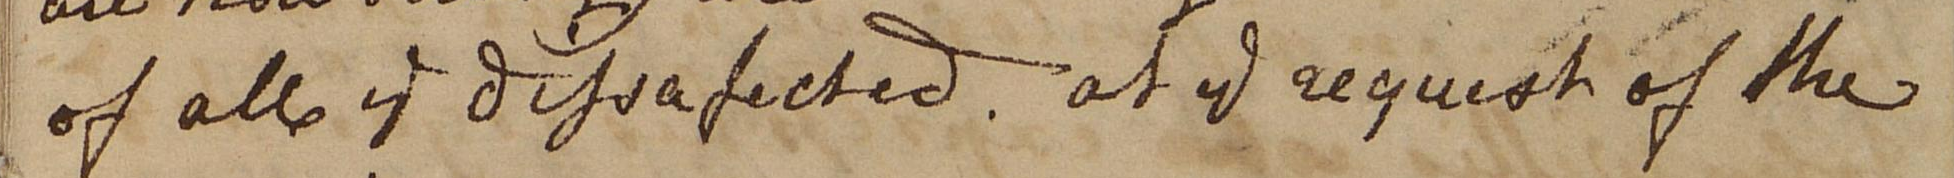of all y^e dissafected. at y^e request of the
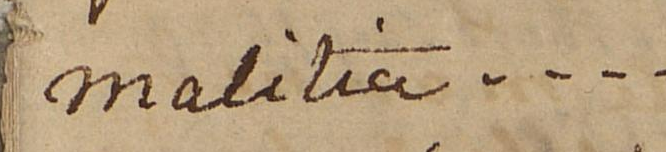malitia----
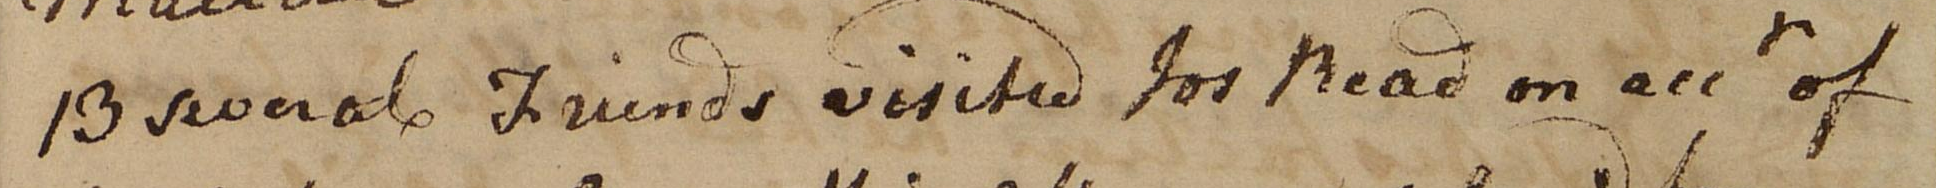13 several Friends visited Jos Read on acc^t of
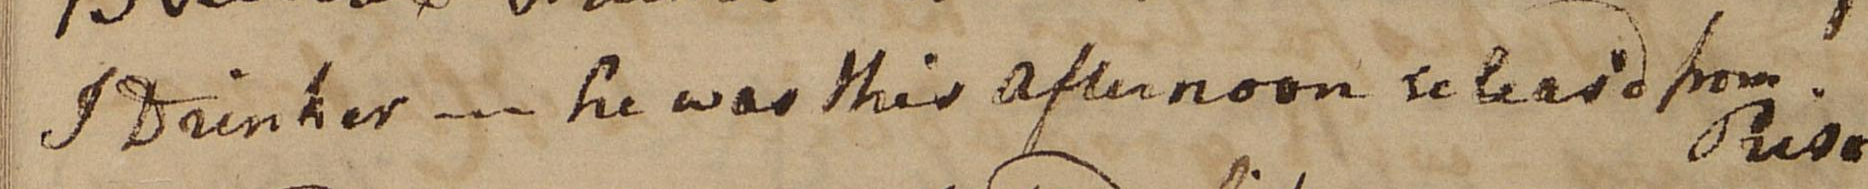I Drinker- he was this afternoon releas'd from.
